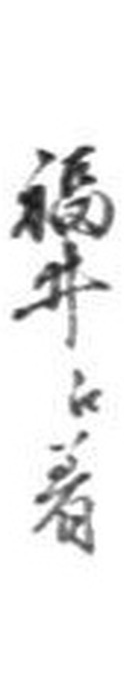福井江着
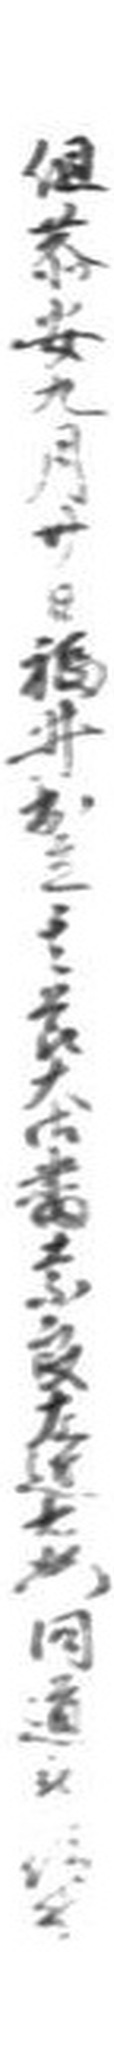但恭安九月廿日福井出立其節大御番奈良左近右衛門同道被仰付
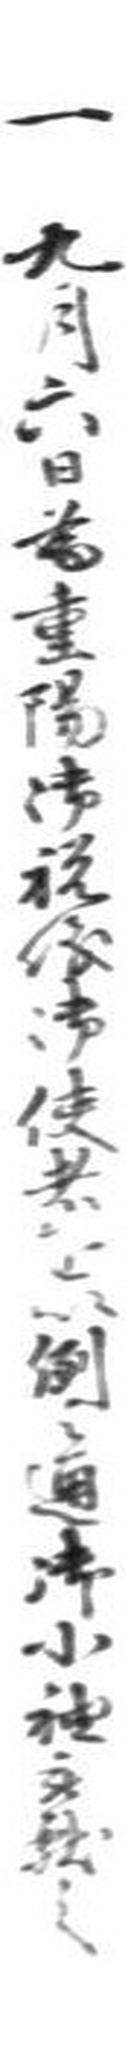一九月六日為重陽御祝儀御使者を以例之通御小袖被献之
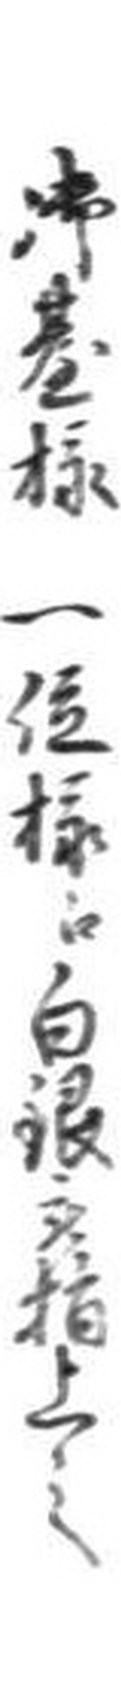御台様一位様江白銀被指上之
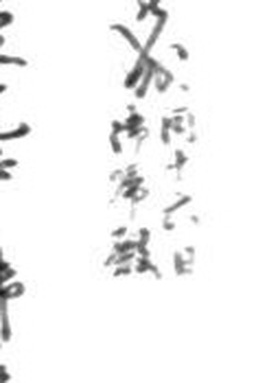御帰殿

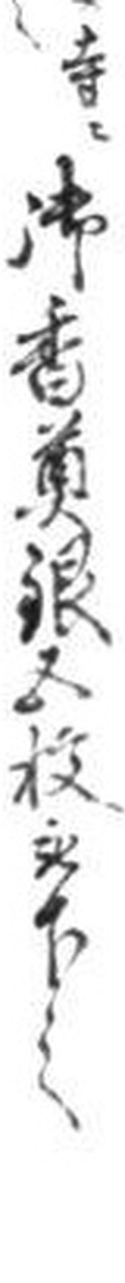有之御香奠銀五枚被下之
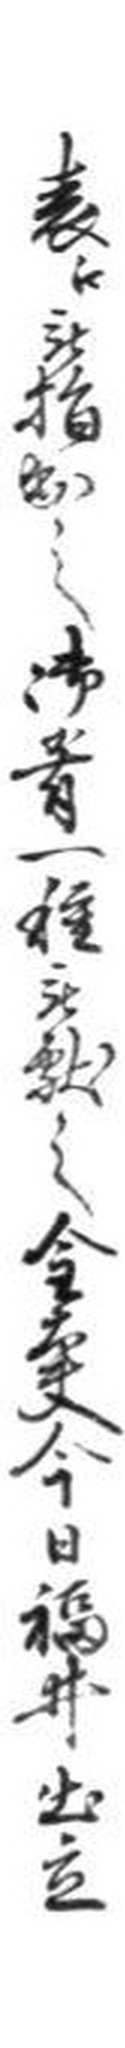表江被指出之御肴一種被献之金太夫今日福井出立
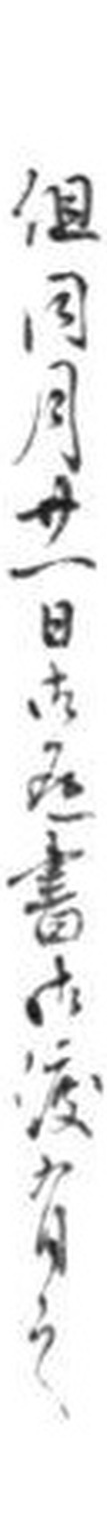但同月廿一日御返書御渡有之
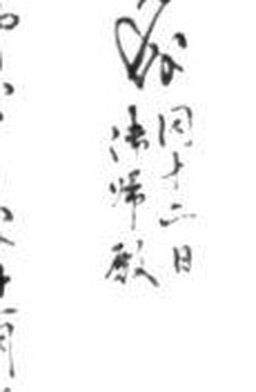御帰殿
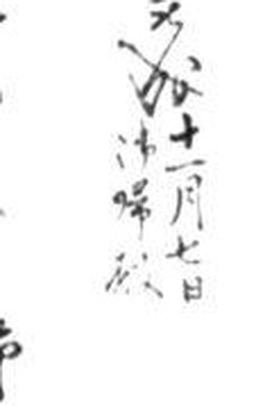御帰殿
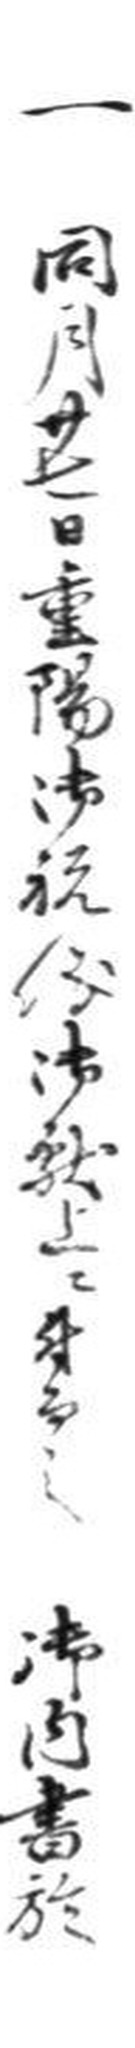一同月廿七日重陽御祝儀御献上ニ付而之御内書於
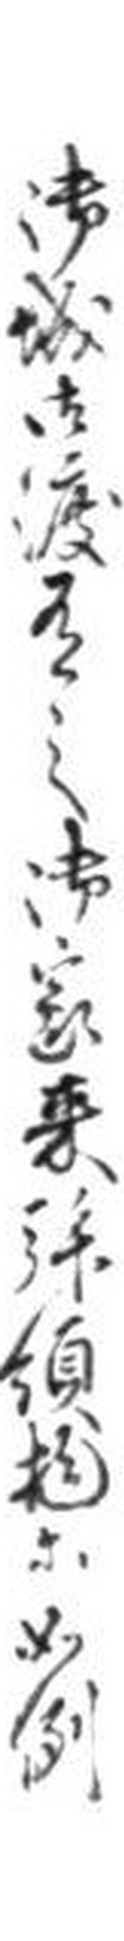御城御渡有之御家来拝領物等如例
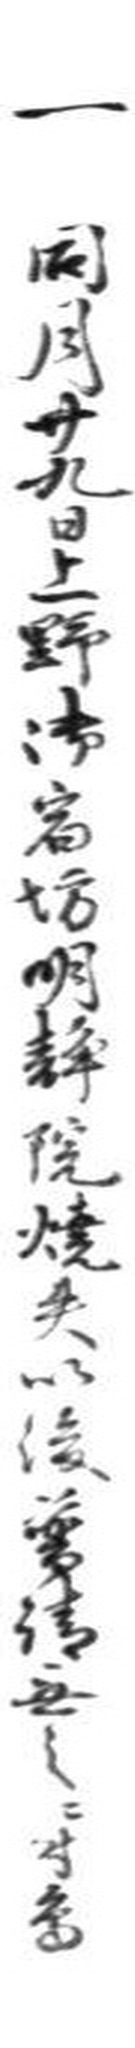一同月廿九日上野御宿坊明静院焼失以後普請無之ニ付鳥
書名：家譜 二十二 吉品公 従元禄十五年到同十六年
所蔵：福井県文書館 Fukui Prefectural Archives
